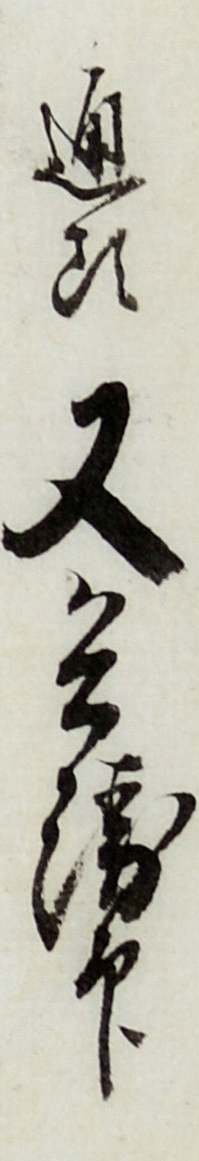通頭又兵衛印
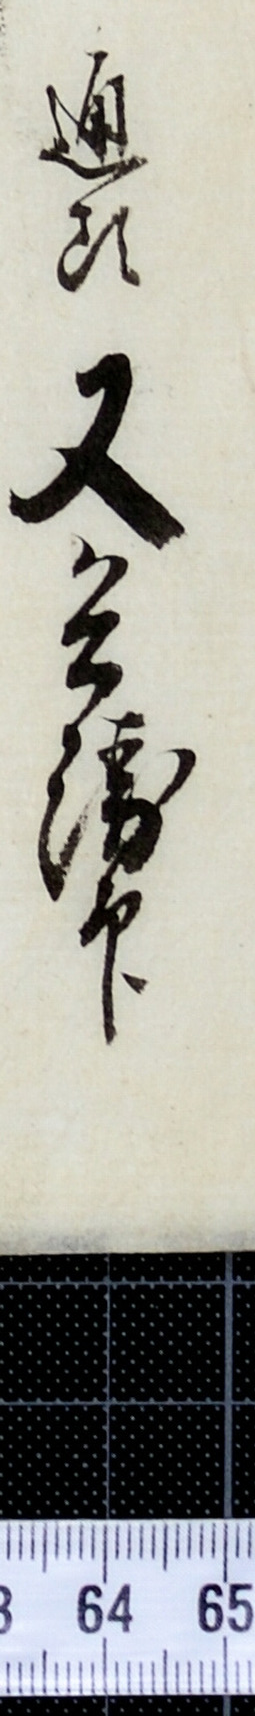通頭又兵衛印
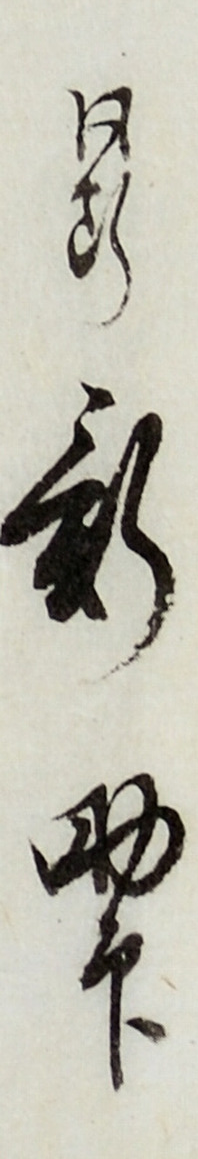同断新助印
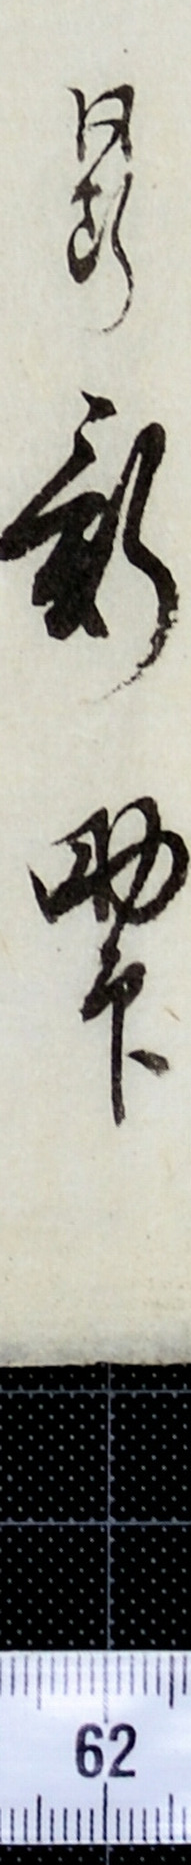同断新助印
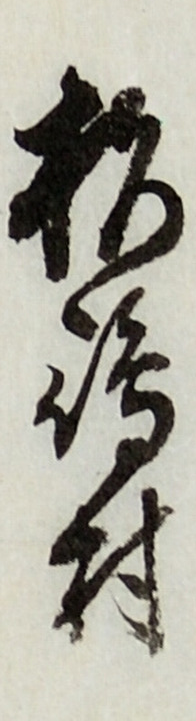杉嶋村
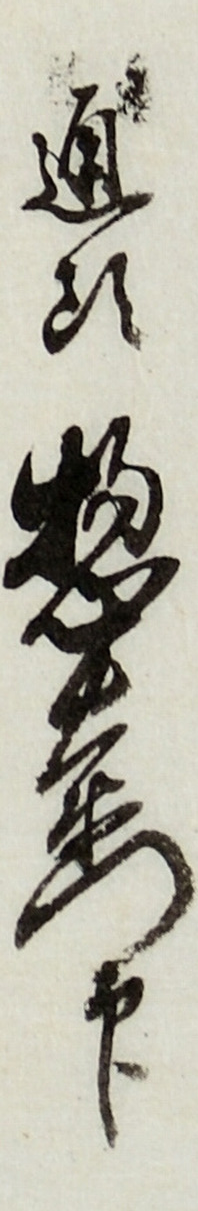通頭惣右衛門印
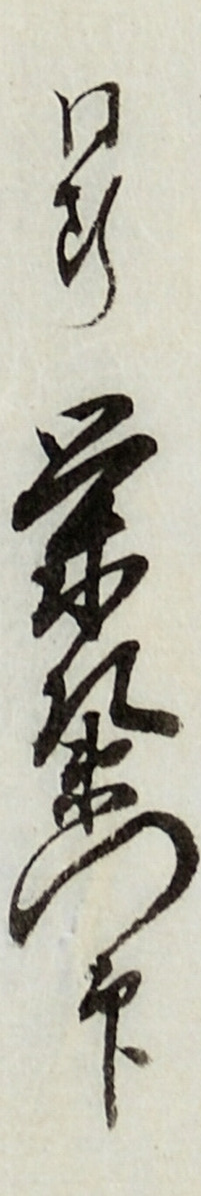同断栄左衛門印
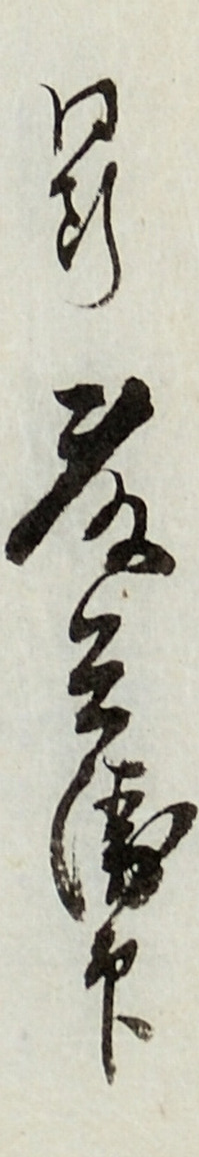同断藤兵衛印
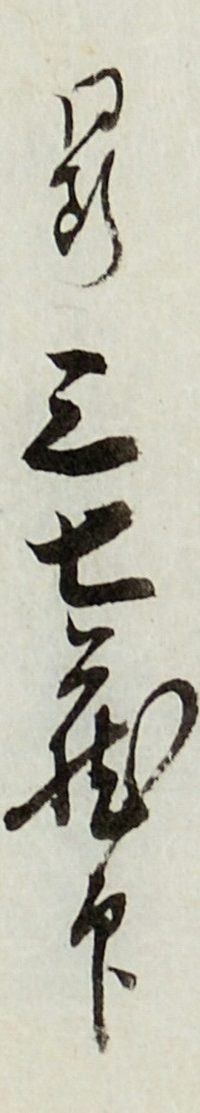同断三七蔵印
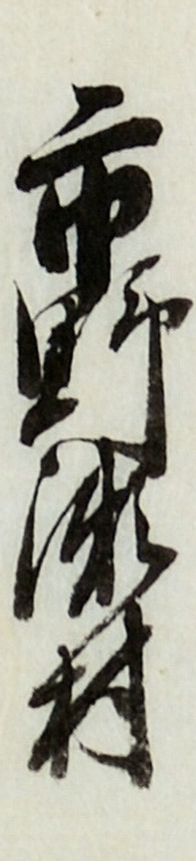市野瀬村
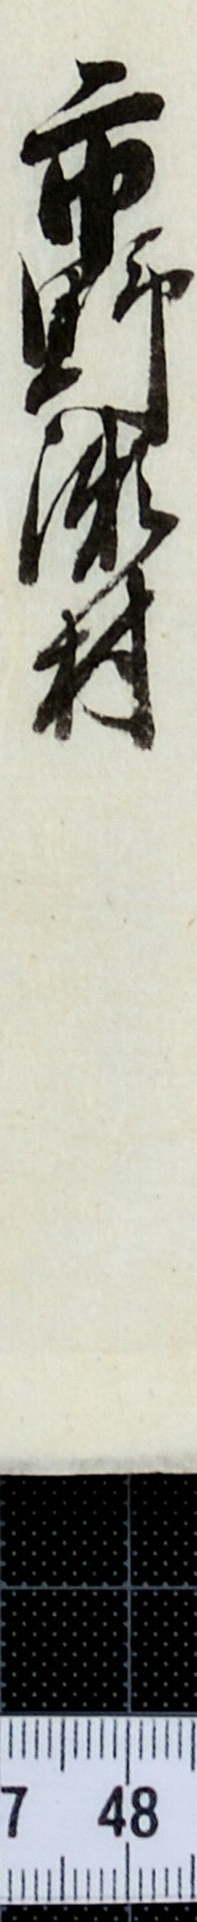市野瀬村
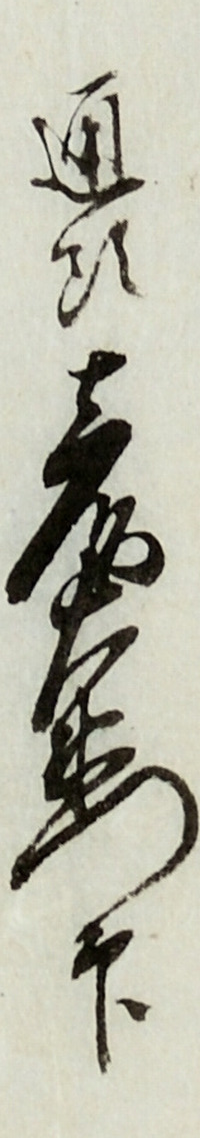通頭彦右衛門印
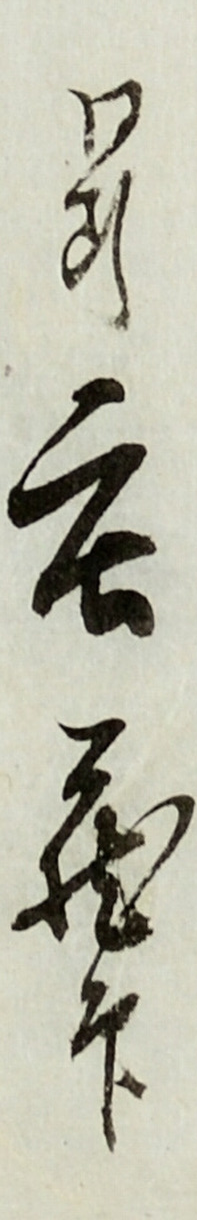同断庄蔵印
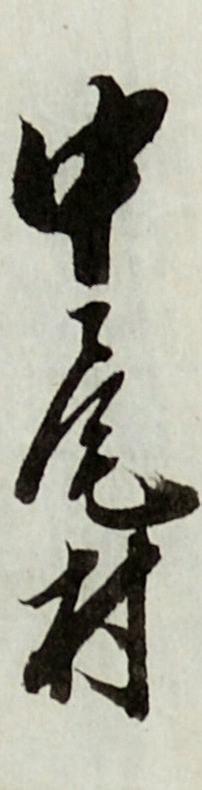中尾村
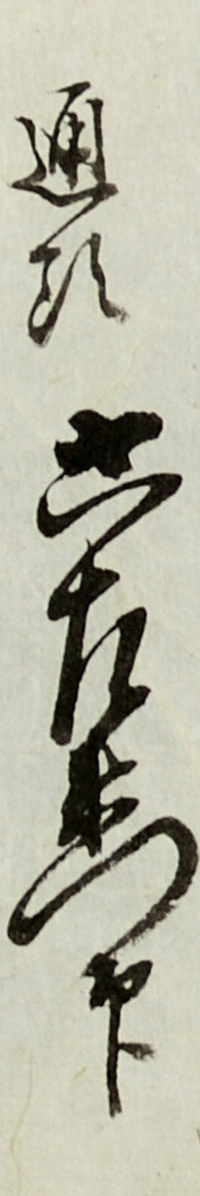通頭六左衛門印
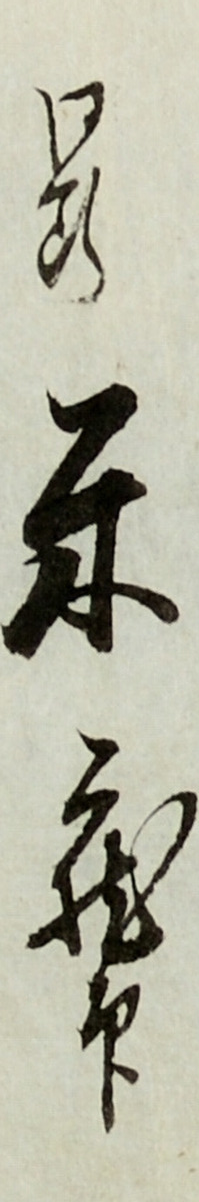同断米蔵印
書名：御薪方掟控
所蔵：伊那市立高遠町図書館・合同会社AMANE
